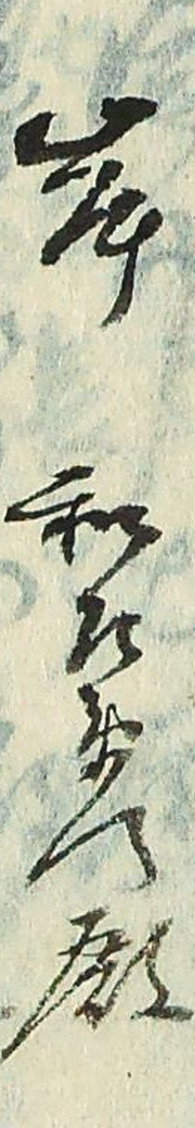岸和左衛門殿
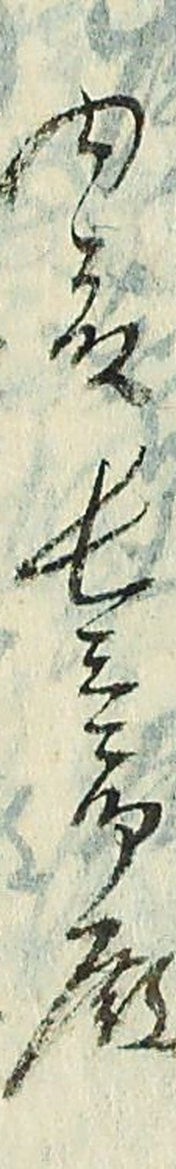内藤長三郎殿
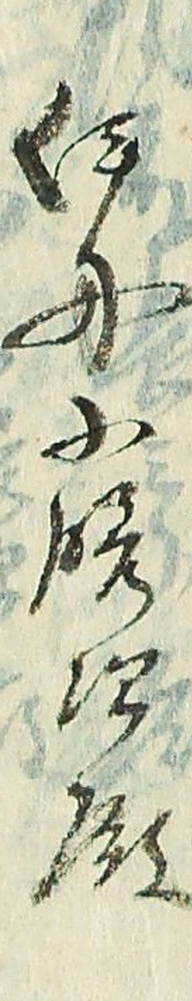伊丹小膳次殿
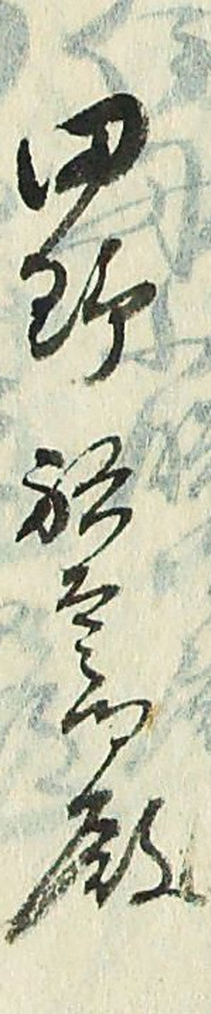田野祐太郎殿

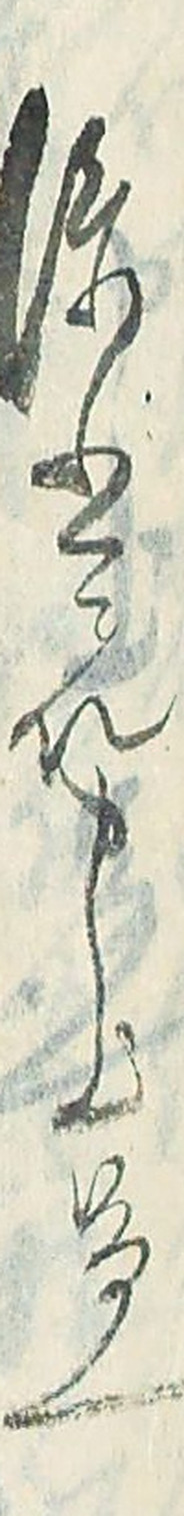添書を以申上覚
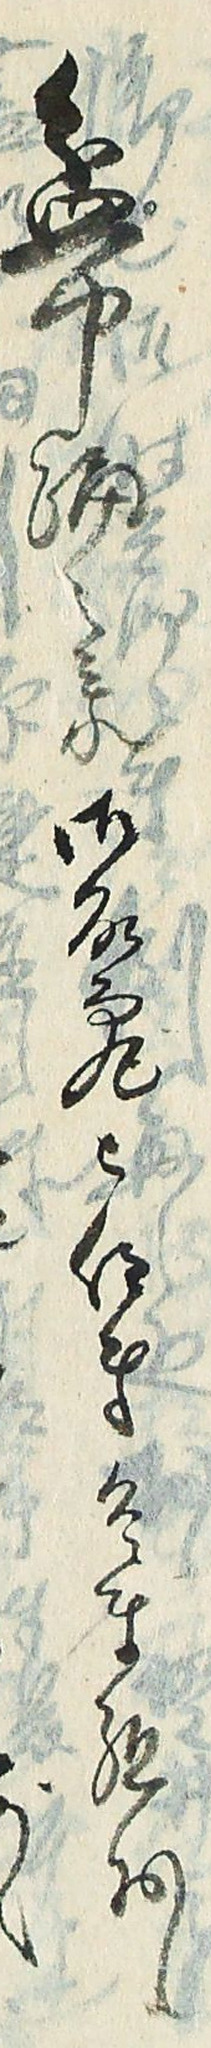盆中踊之義御取究被仰付候に付組村へ
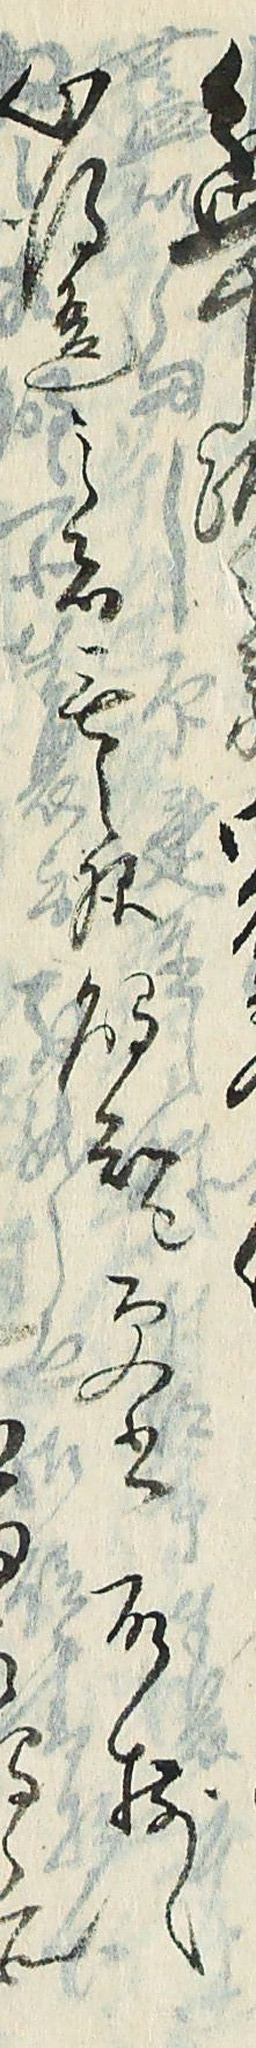心得違之者無之様触知せ受書取揃へ
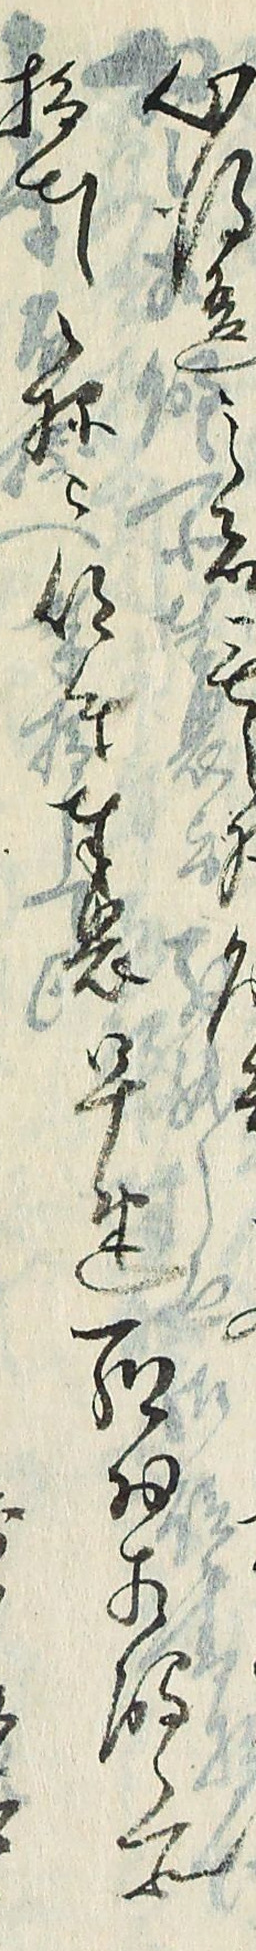指出し候様被仰付奉畏早速組村相触候所
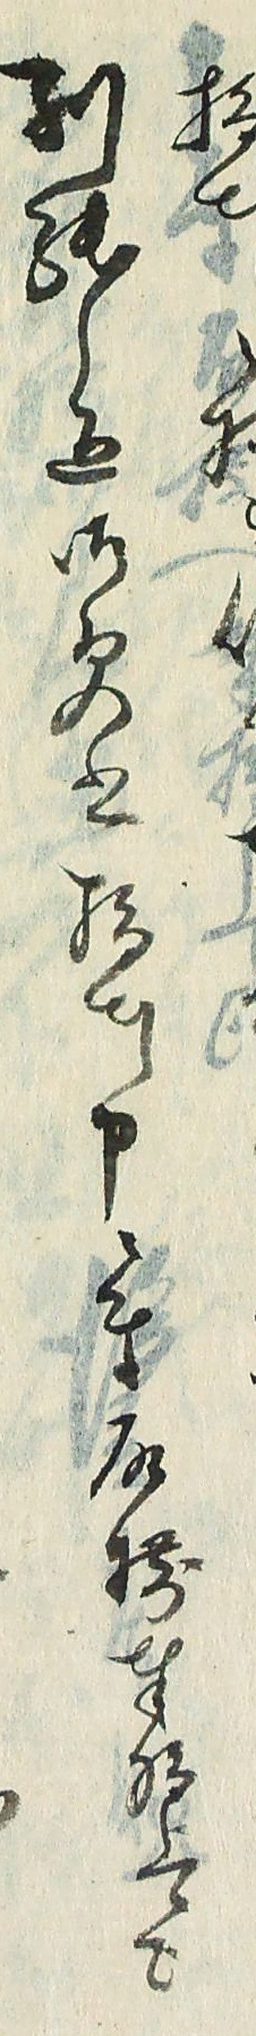別紙之通御受書指出し申に付取揃奉指上候以上
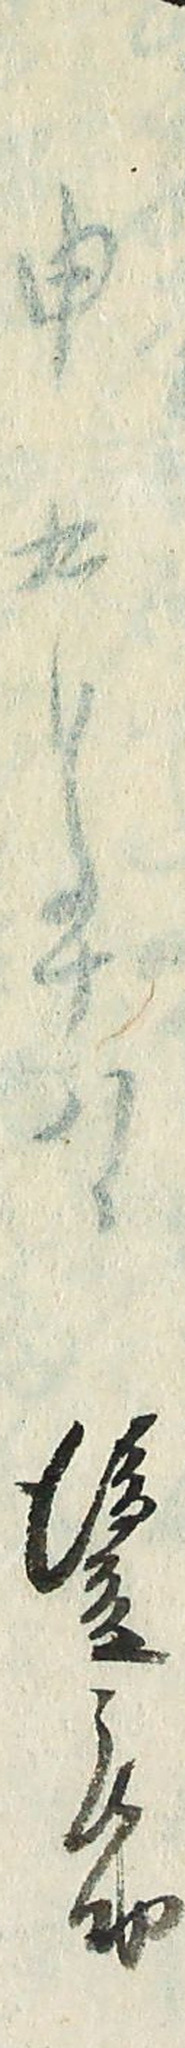後藤庄助
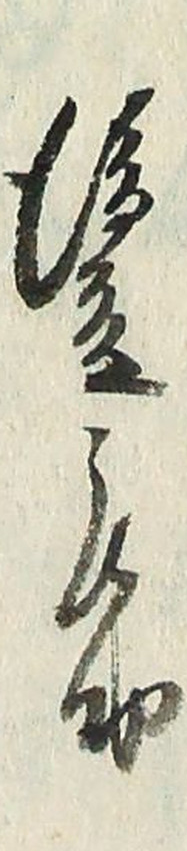後藤庄助
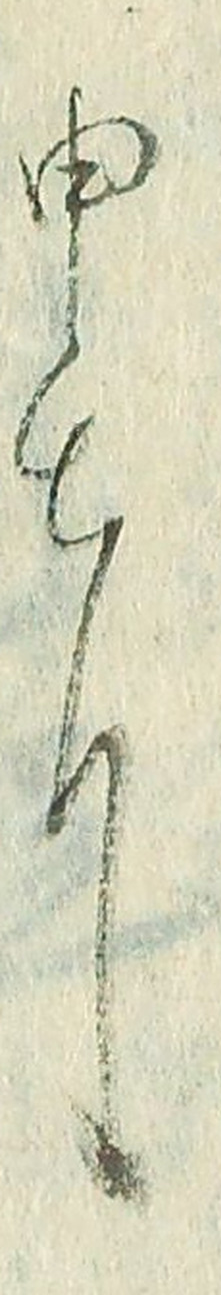申七月
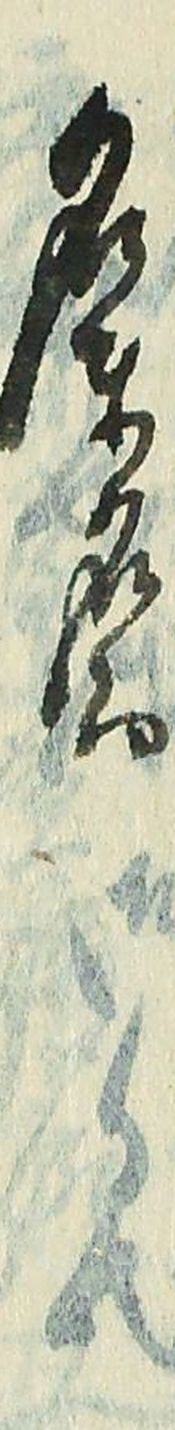名東名西
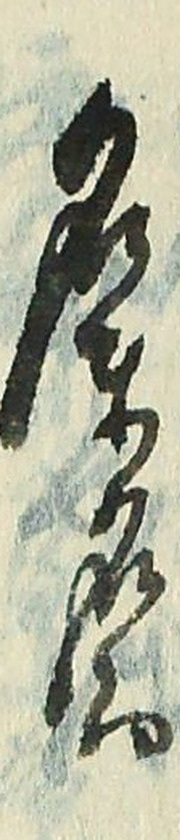名東名西
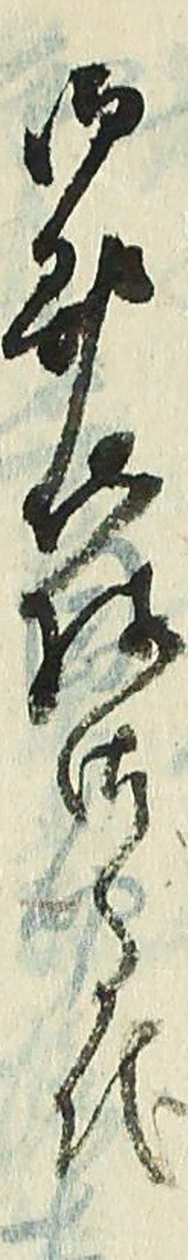御郡代様御手代
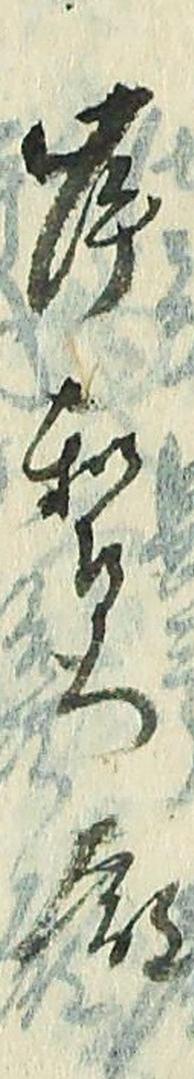岸和左衛門殿
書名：諸御用御□受書控
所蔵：鳴門教育大学 Naruto University of Education
